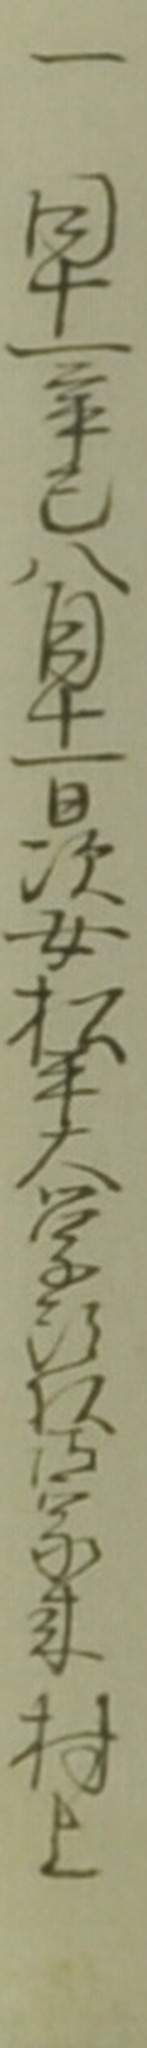一同十一辛巳八月十一日次女松平大学頭様御家来村上
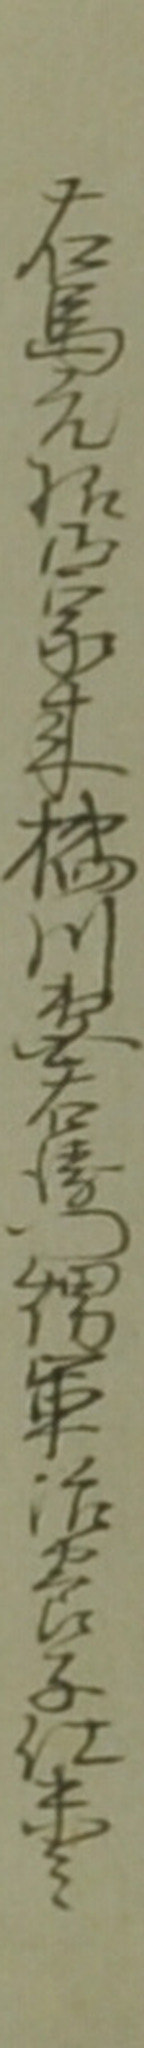右馬允様御家来橋川団右衛門甥軍治養子仕末之

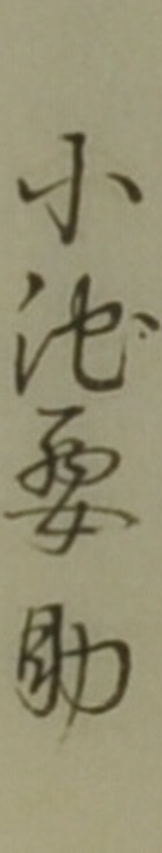小池要助
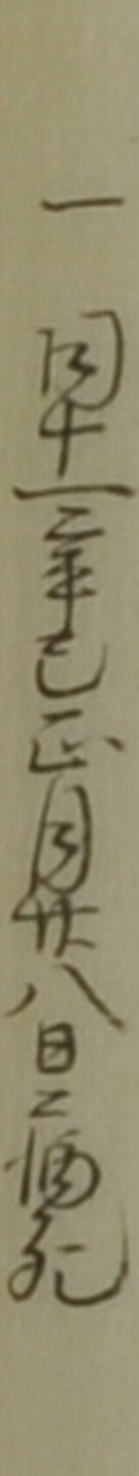一同十一辛巳正月廿八日病死
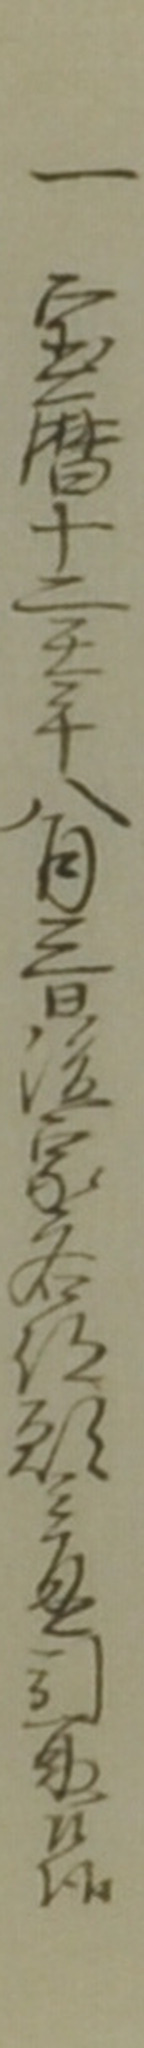一宝暦十二壬午八月三日後家名跡願之通引取候様
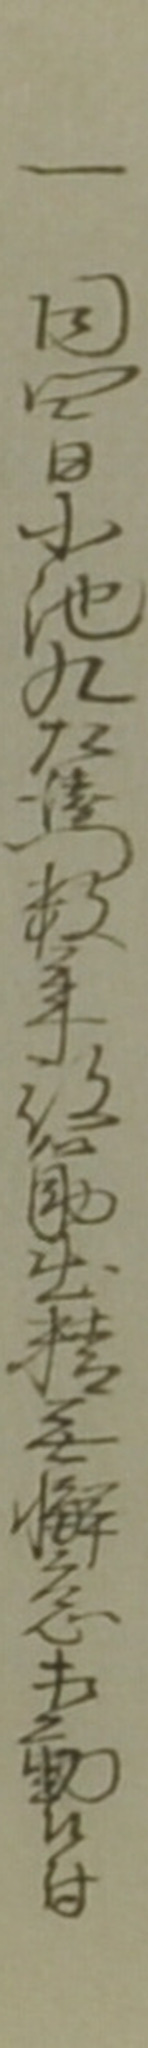一同四日小池九左衛門数年役筋出精無懈怠相勤候付
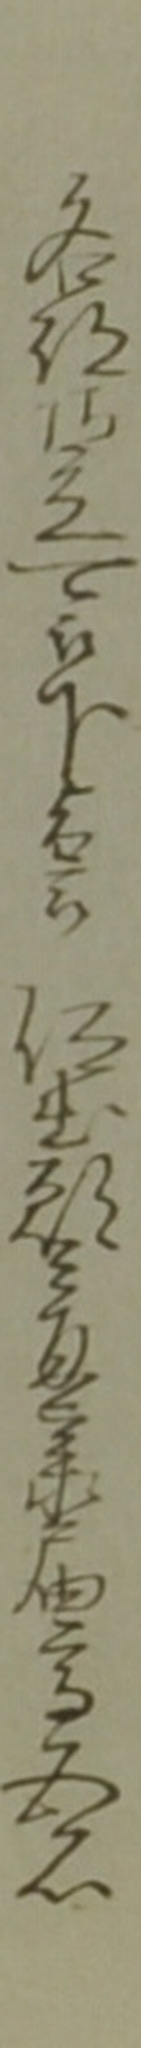名跡御立可被下旨被仰出願之通承届高五石
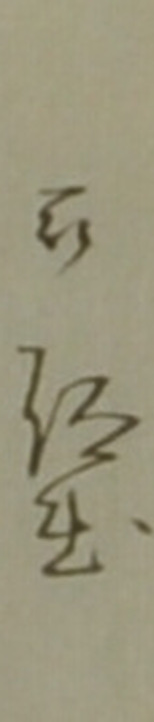被仰出
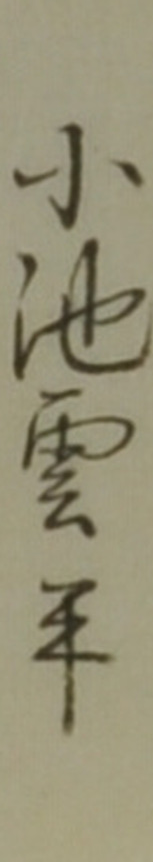小池雲平
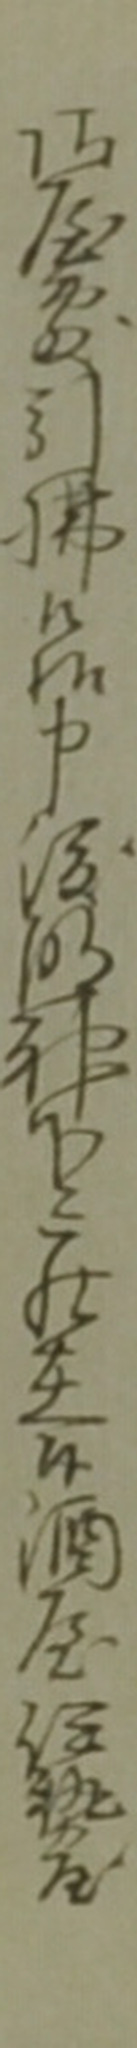御屋敷引払候様申渡明神下ニ罷在候酒屋伊勢屋

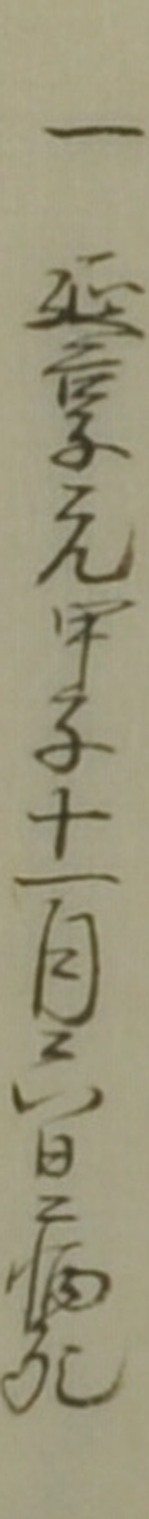一延享元甲子十一月六日病死
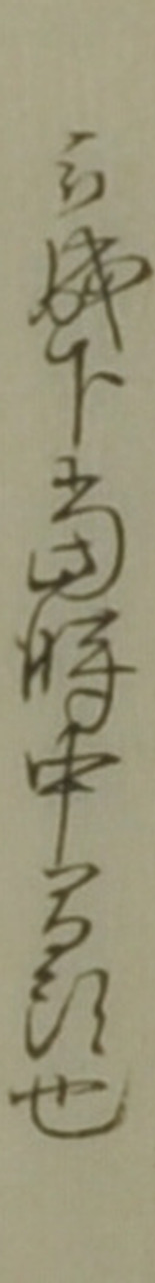被成下当時中間頭也
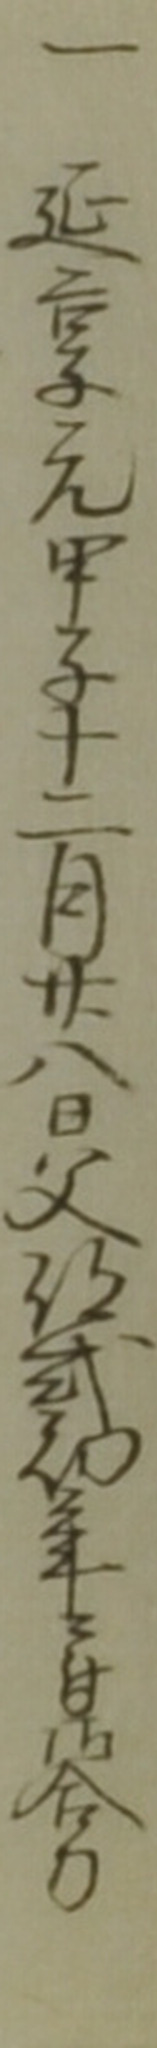一延享元甲子十二月廿八日父跡式幼年ニ付御合力
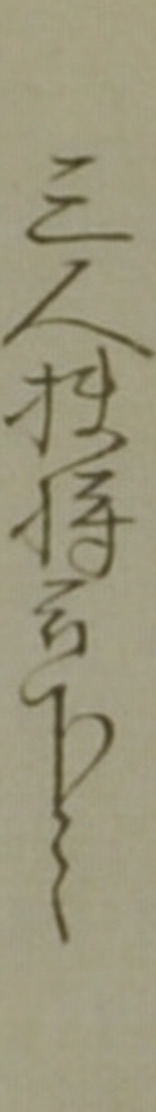三人扶持被下之
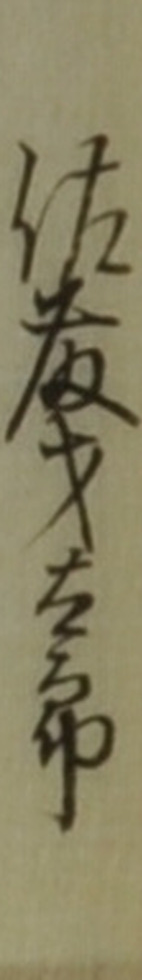佐藤才太郎
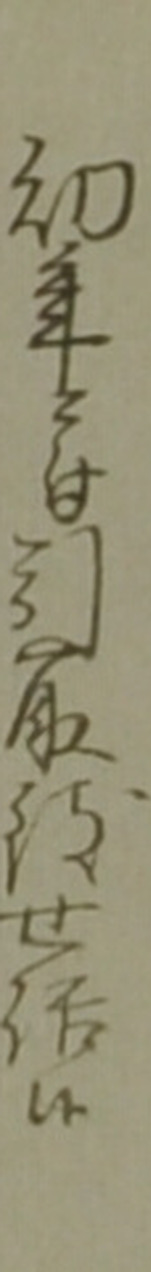幼年ニ付引取致世話候
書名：無足廃家（弐）
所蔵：伊那市立高遠町図書館・合同会社AMANE
